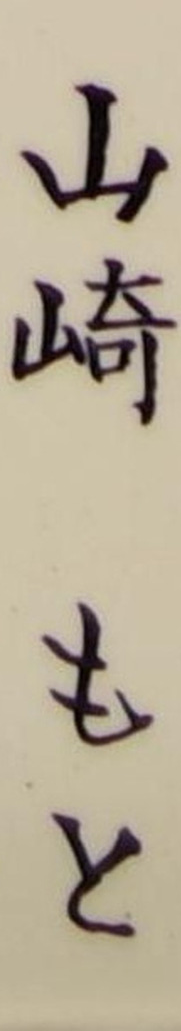山崎もと
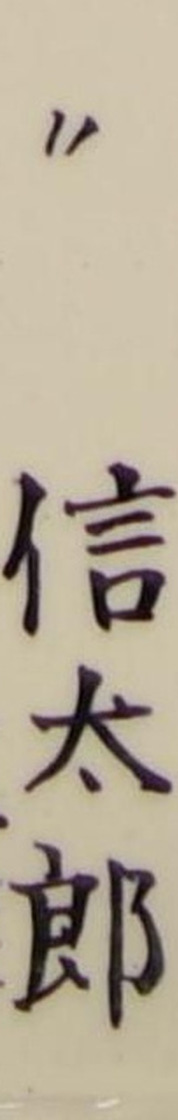信太郎
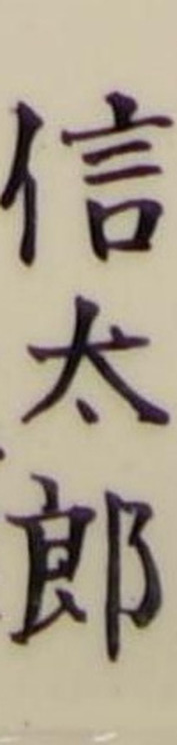信太郎
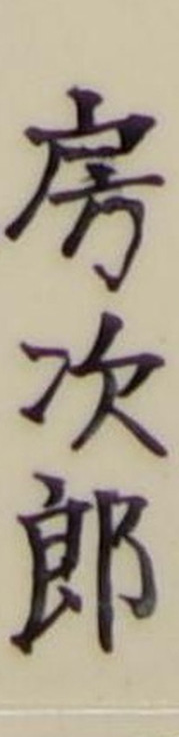房次郎
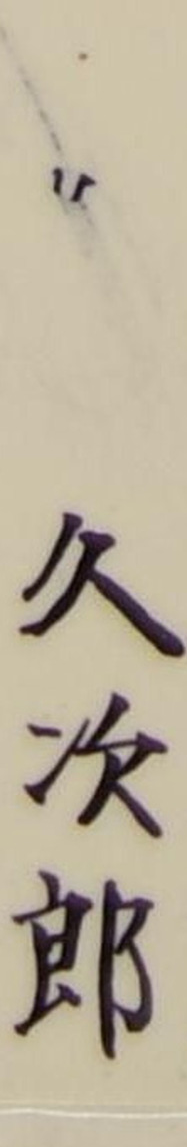久次郎
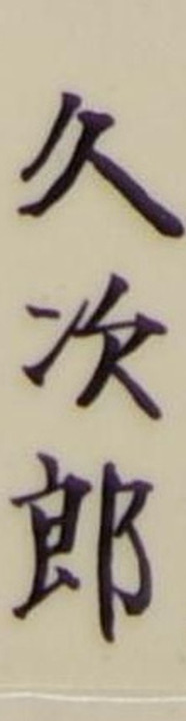久次郎
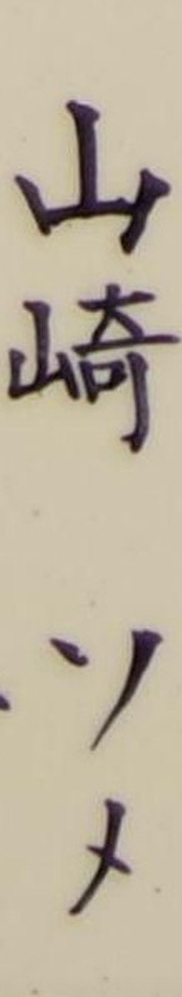山崎ソメ
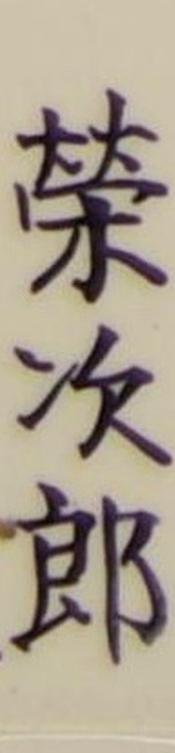榮次郎

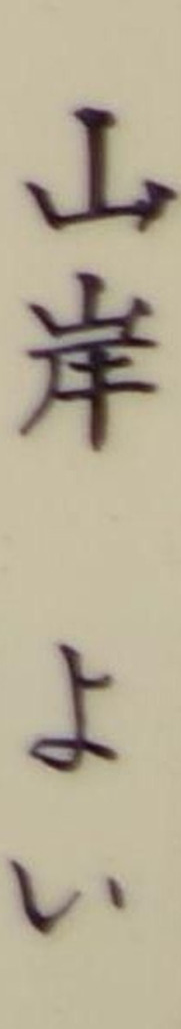山岸よい
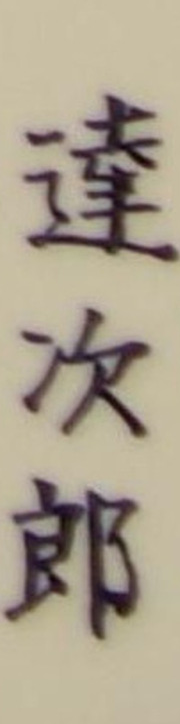達次郎
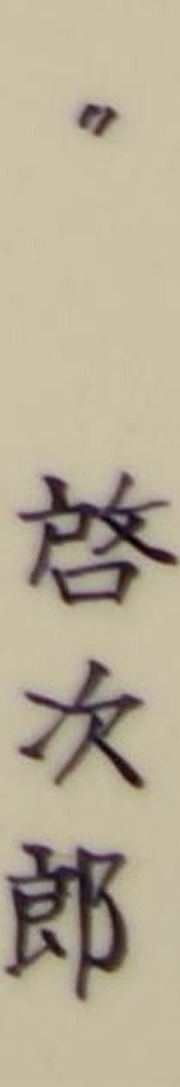啓次郎
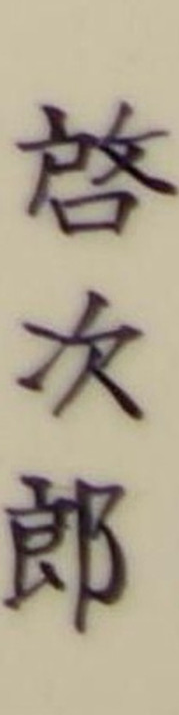啓次郎
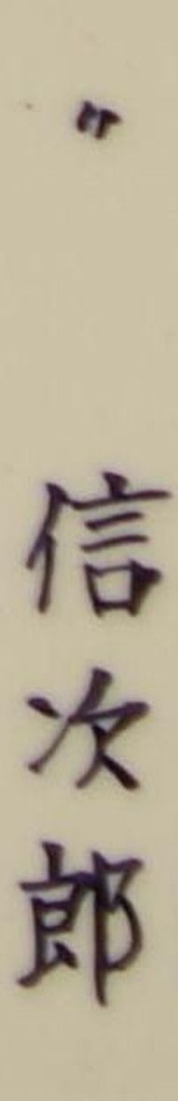信次郎
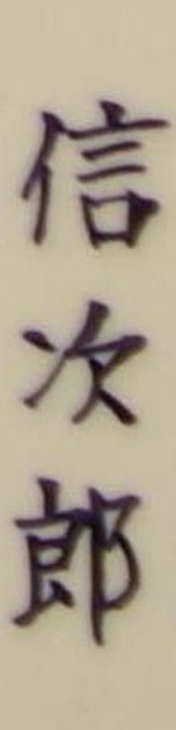信次郎
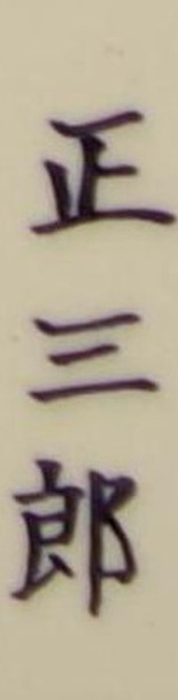正三郎
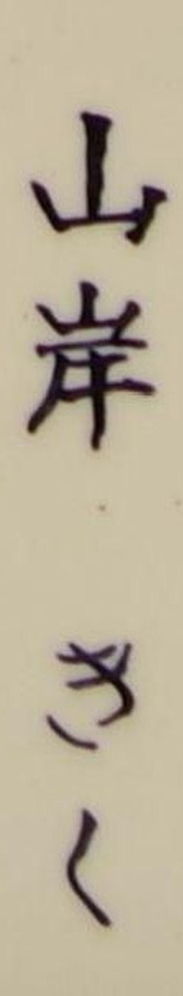山岸きく
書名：A~D
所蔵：koyasan kongobuji
